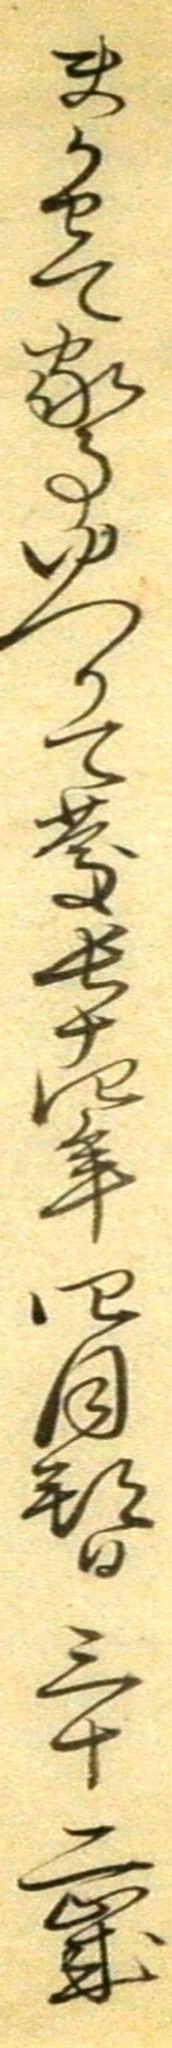まかせて家事ゆつりて慶長十四年四月朔日三十二歳
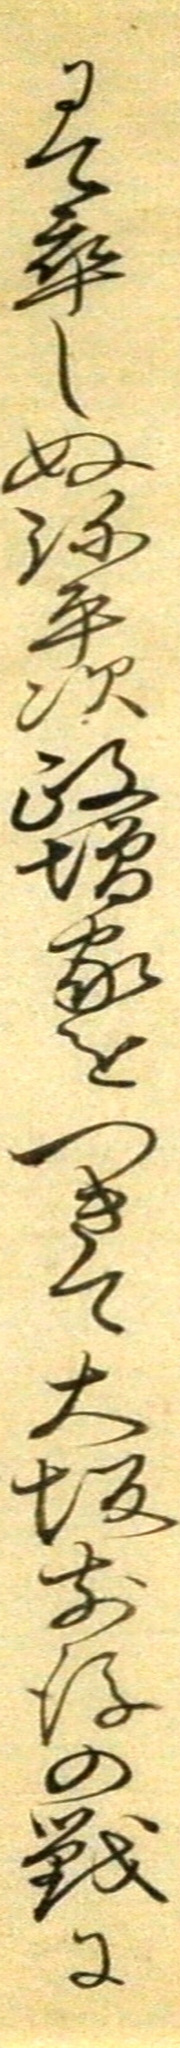にて卒しぬ弥平次政増家をつきて大坂前後の戦に
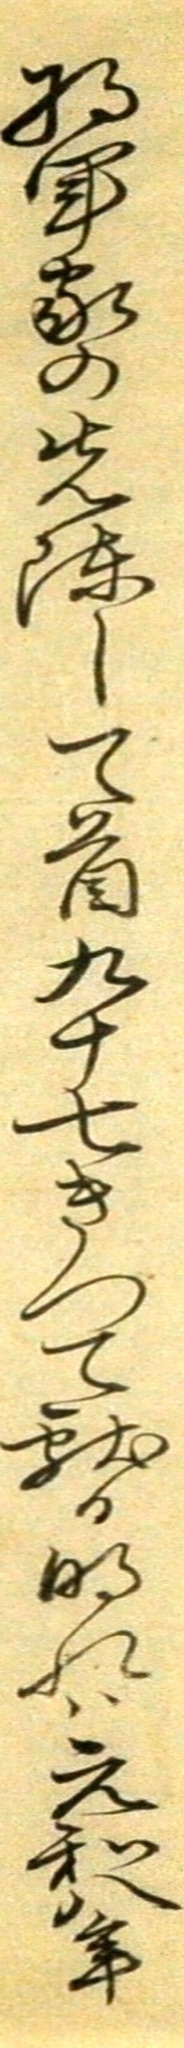将軍家の先陣して首九十七きつて献る明れは元和八年

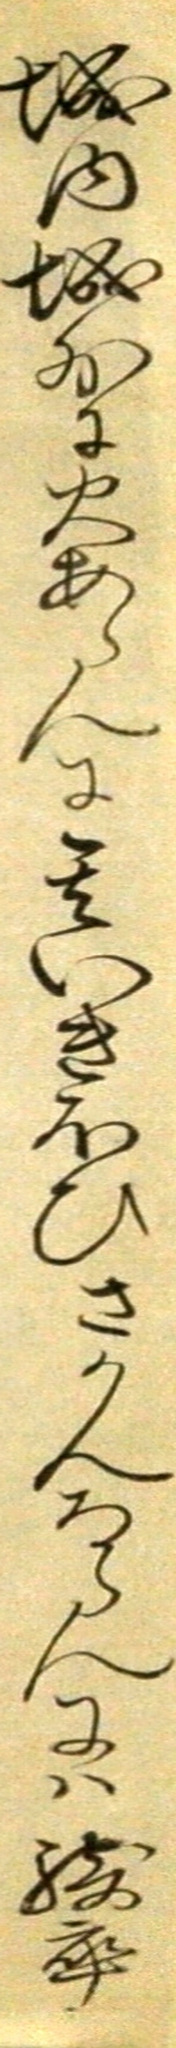城内城外に火あらんに其いきほひさかんならんには騎卒
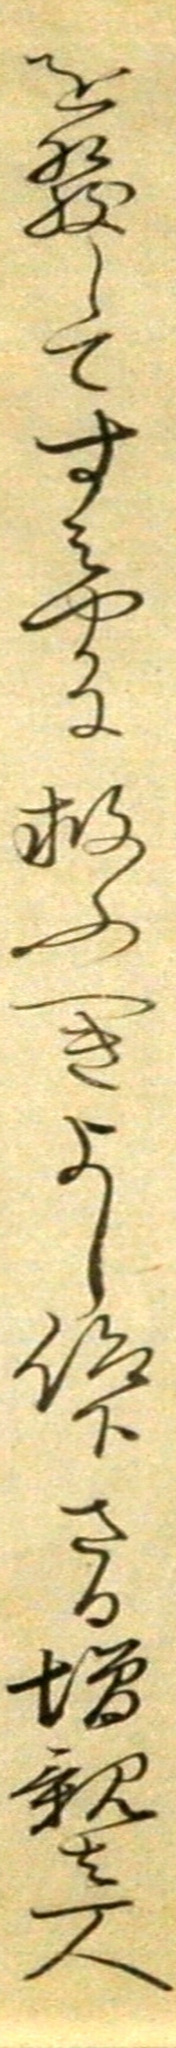を発してすみやかに救ふへきよし仰下さる増親は一人
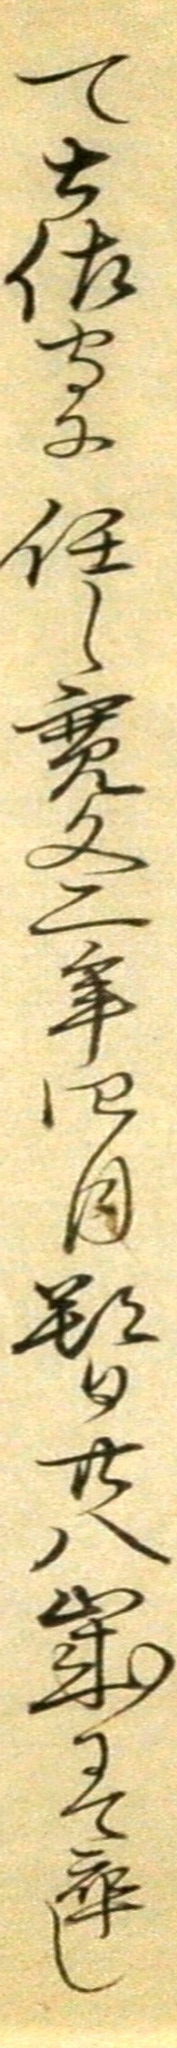て土佐守に任し寛文二年四月朔日廿八歳にて卒し
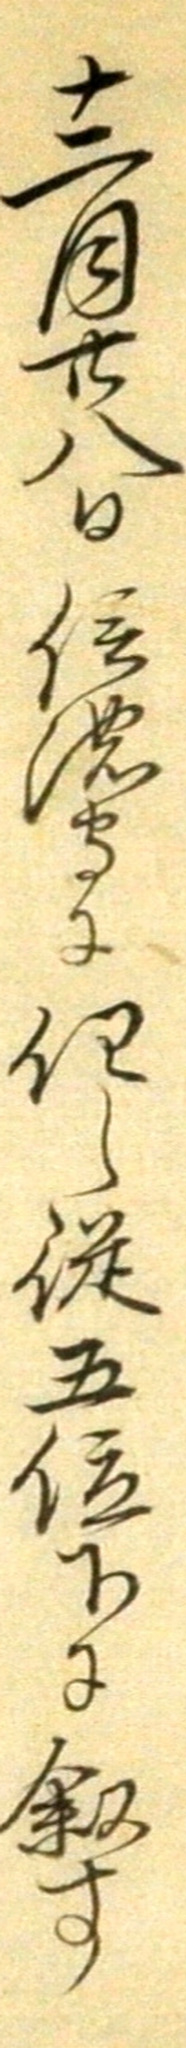十二月廿八日信濃守に任し従五位下に叙す
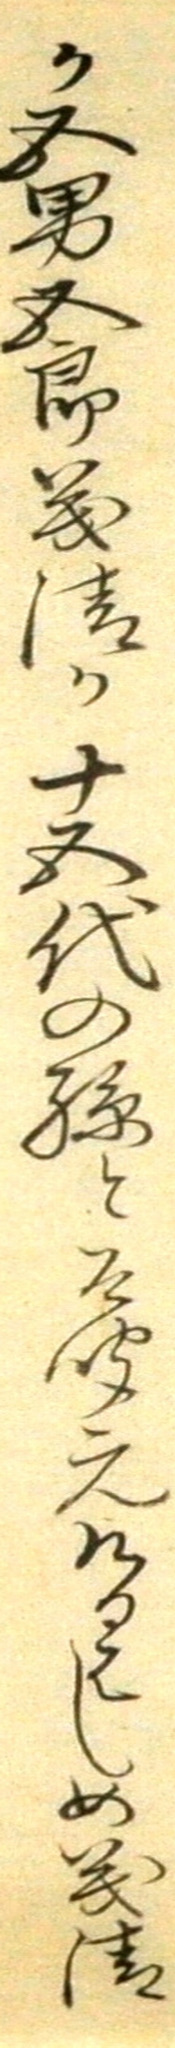か五男五郎義清か十五代の孫とそ聞えけるはしめ義清
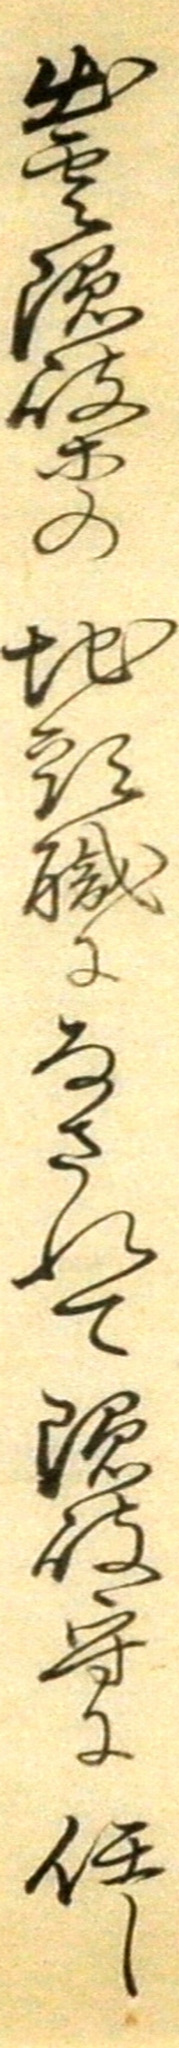出雲隠岐等の地頭職になされて隠岐守に任し
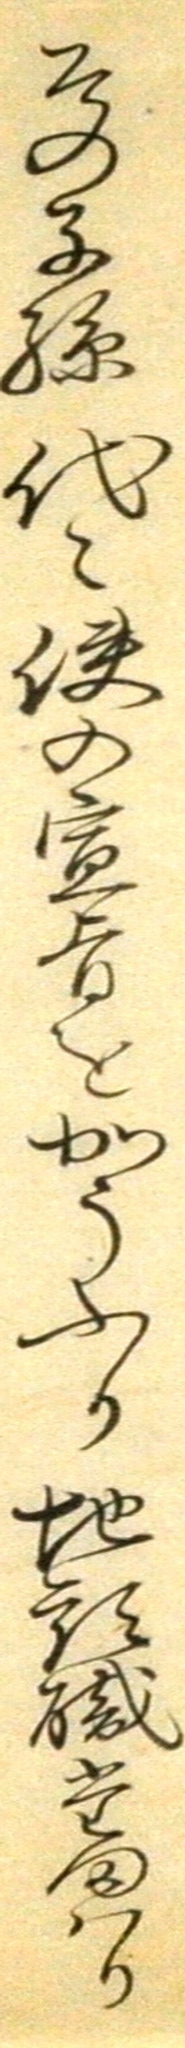その子孫代々使の宣旨をかうふり地頭職たまはり
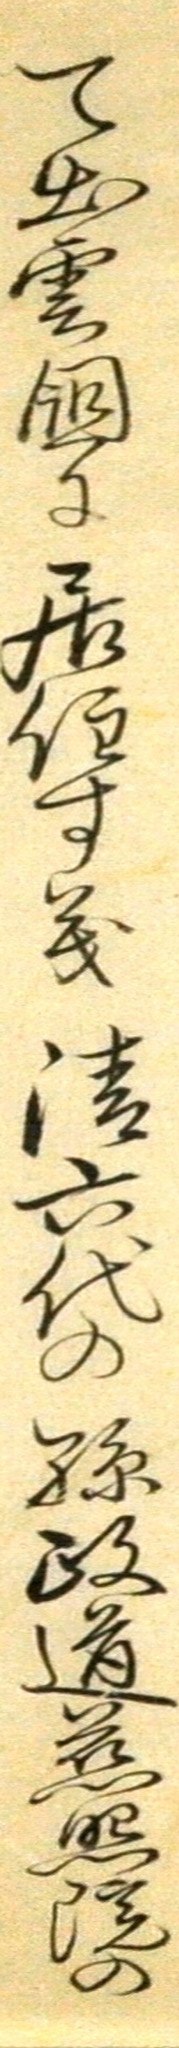て出雲国に居住す義清六代の孫政道慈照院の
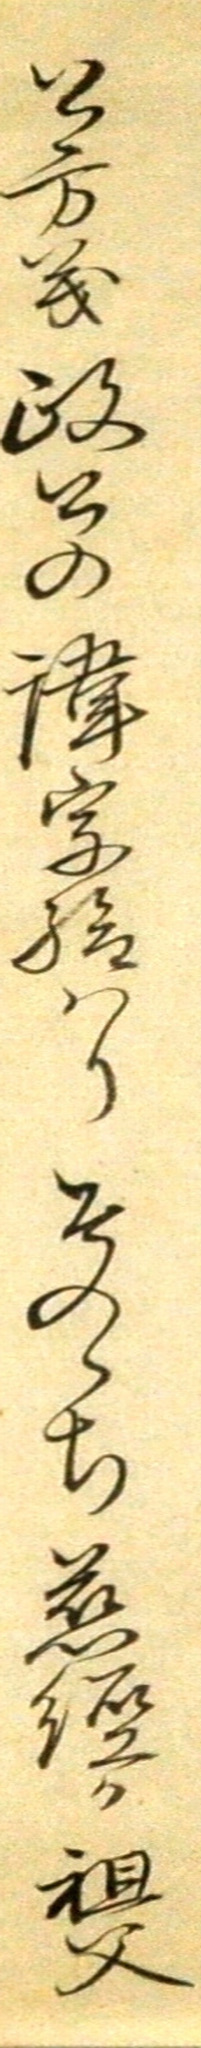公方義政公の諱字給はりそのゝち慈経か祖父
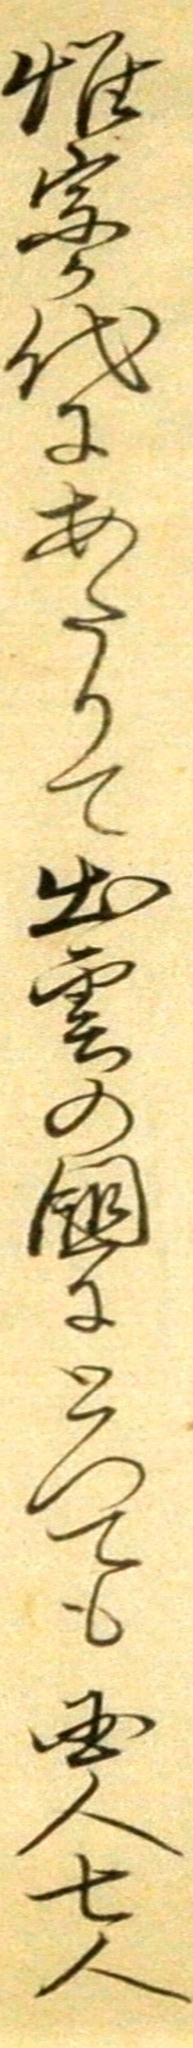惟宗か代にあたりて出雲の国にとつても国人七人
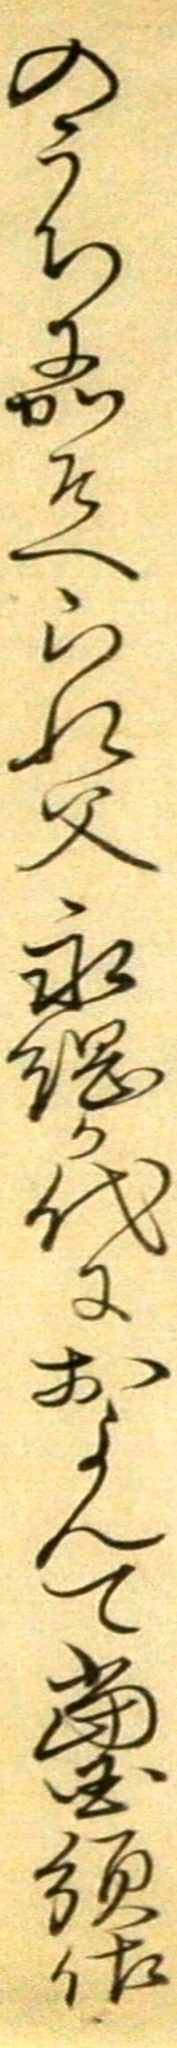のうちにかそへられ父永綱か代におよんて当国須佐
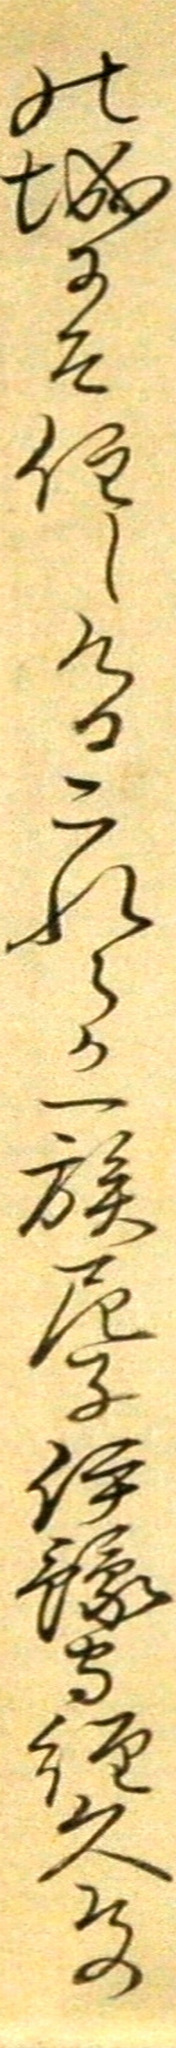の城にそ住しけるこれらか一族尼子伊予守経久その

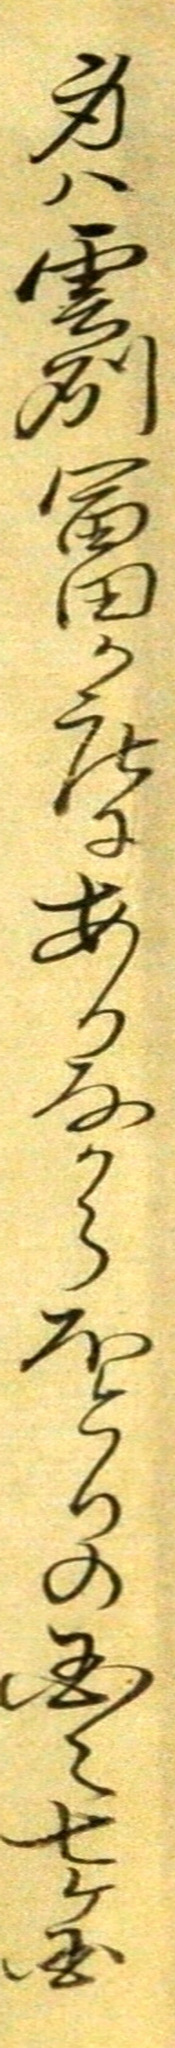身は雲州富田か庄にありなからほとりの国々七ヶ国
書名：藩翰譜（九・下）
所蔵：伊那市立高遠町図書館・合同会社AMANE
